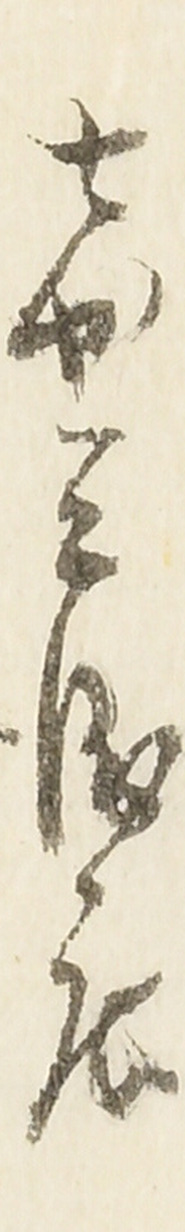九郎兵衛店
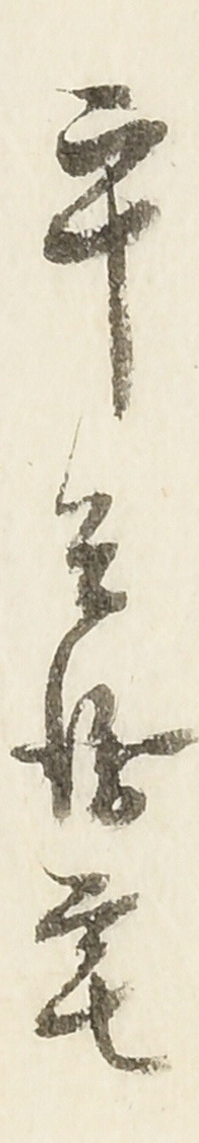平兵衛宅
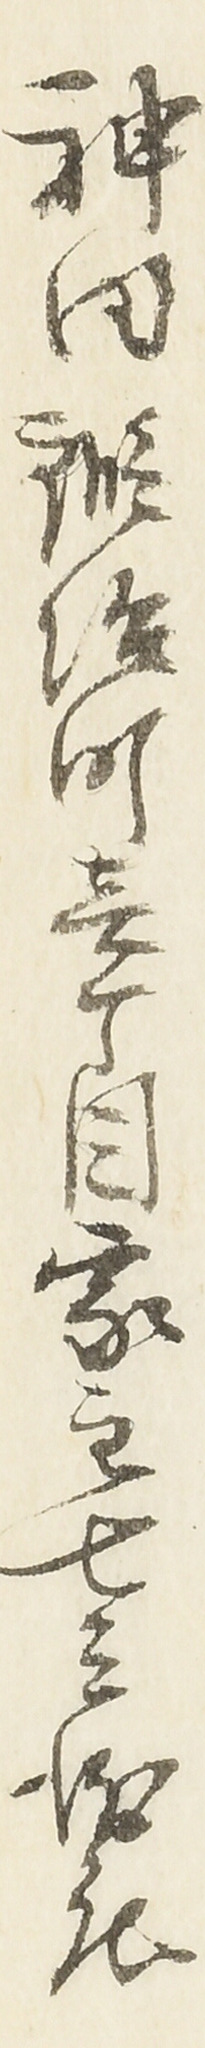神田鍛冶町壱丁目家主七兵衛店
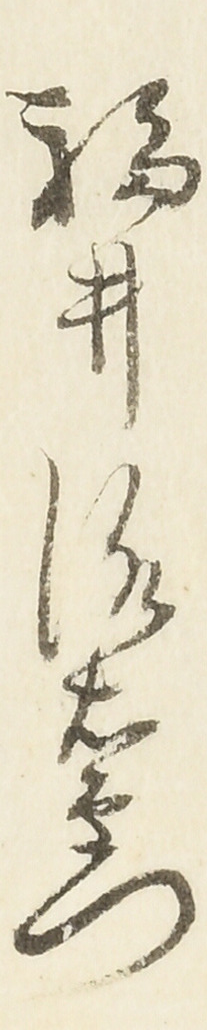福井治右衛門
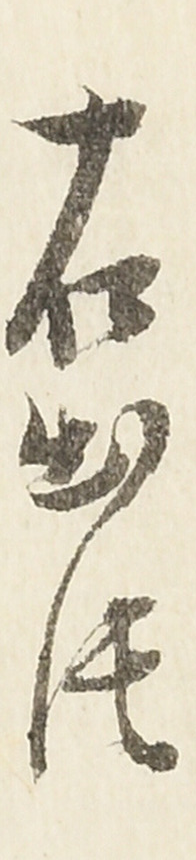右出張
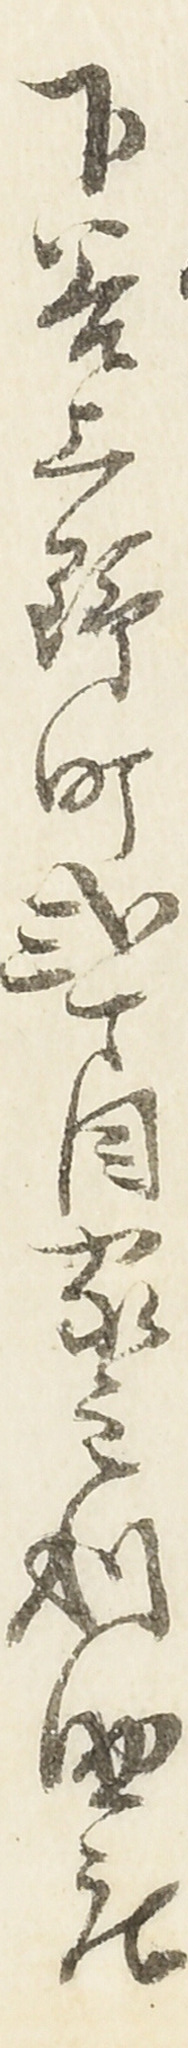下谷上野町弐丁目家主利助店
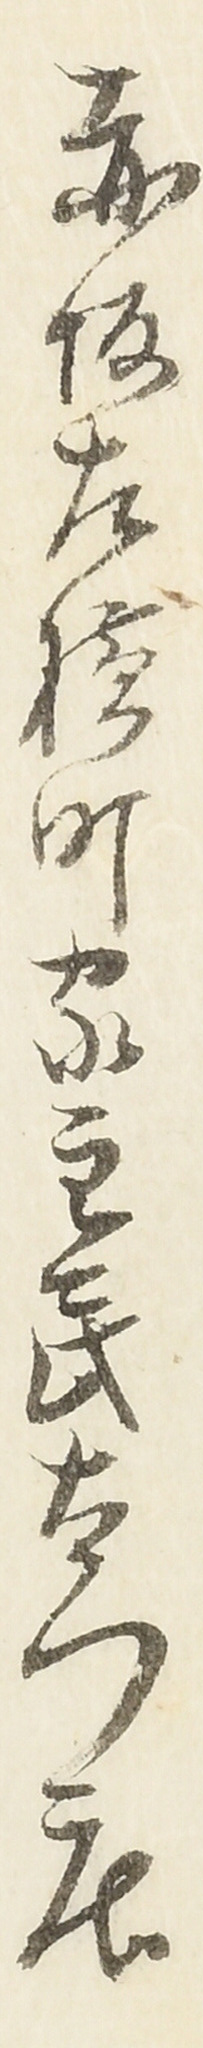赤坂左横町家主民右衛門店
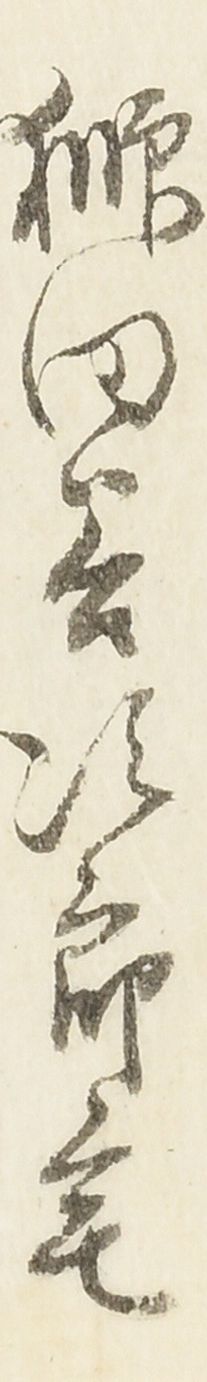柳田善次郎宅
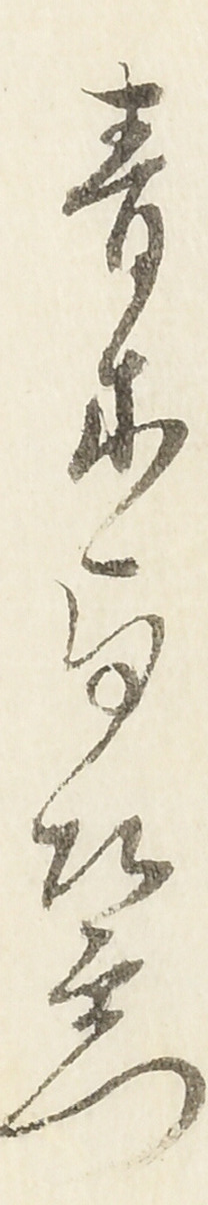青木与左衛門

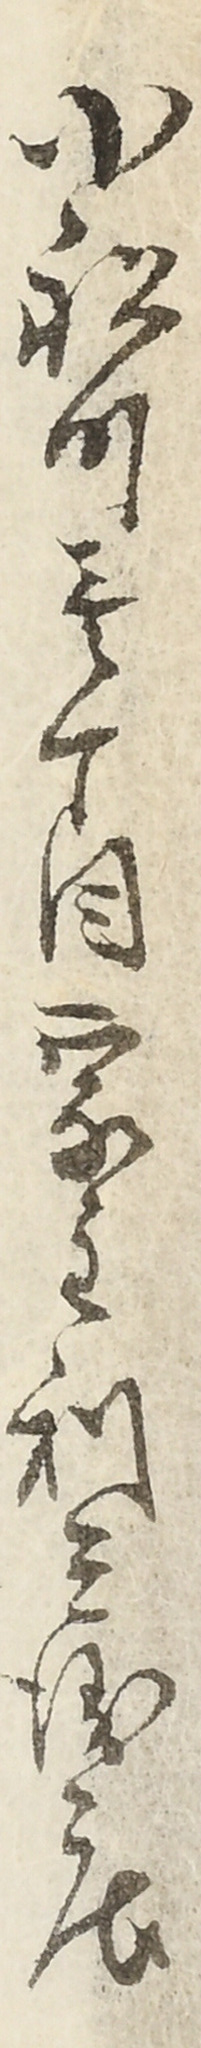小船町壱丁目家主利兵衛店
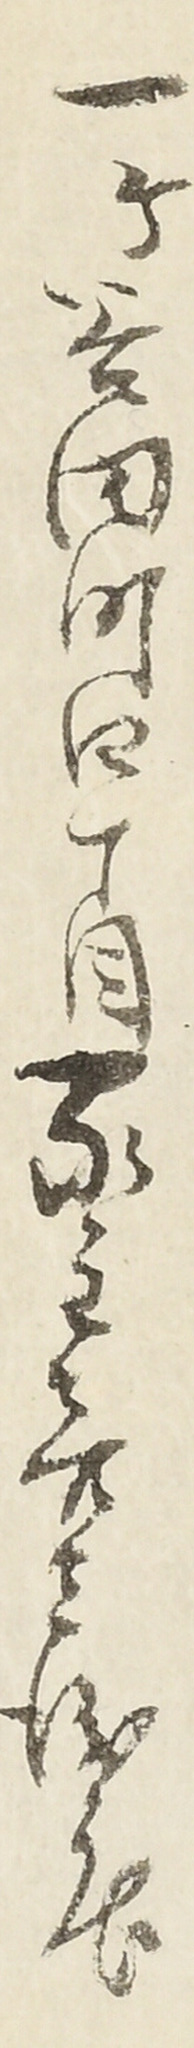一ヶ谷田町四十目家主喜兵衛店
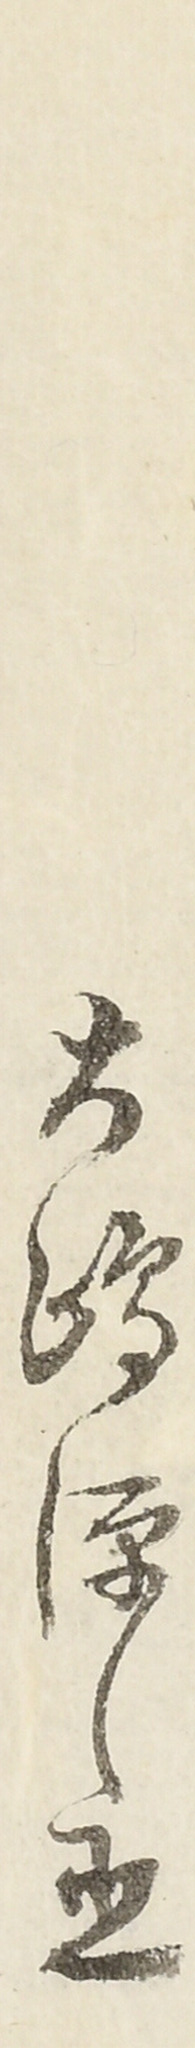大嶋源之丞
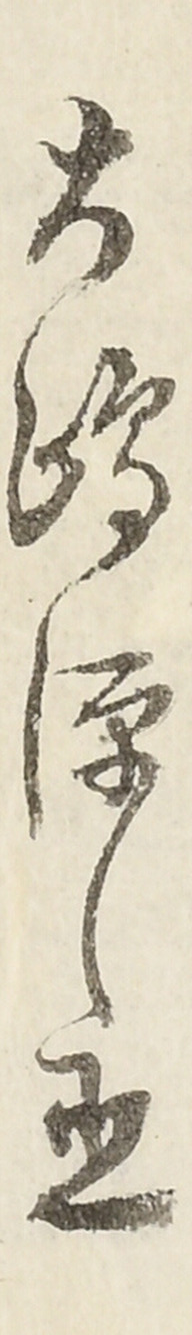大嶋源之丞
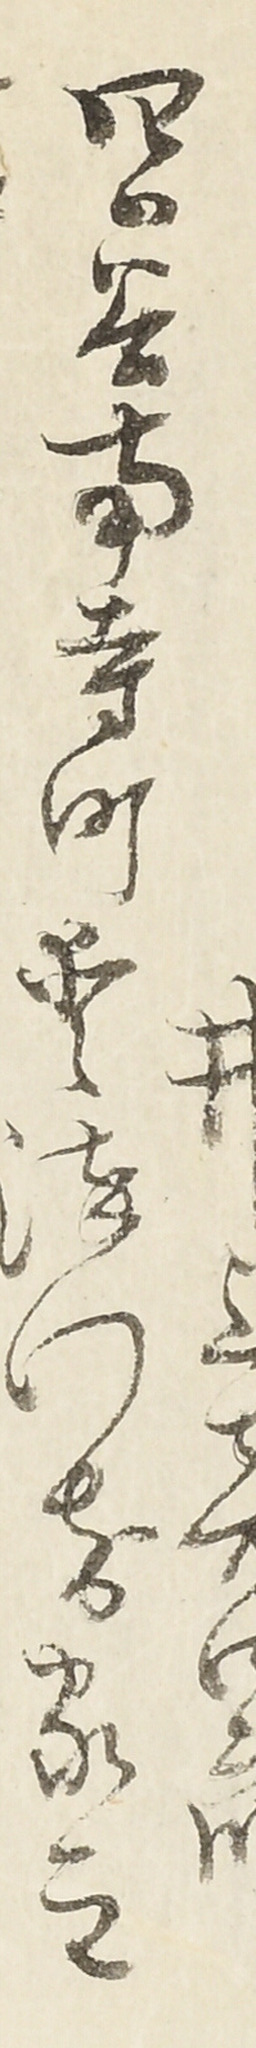四ツ谷南寺町愛門前家主
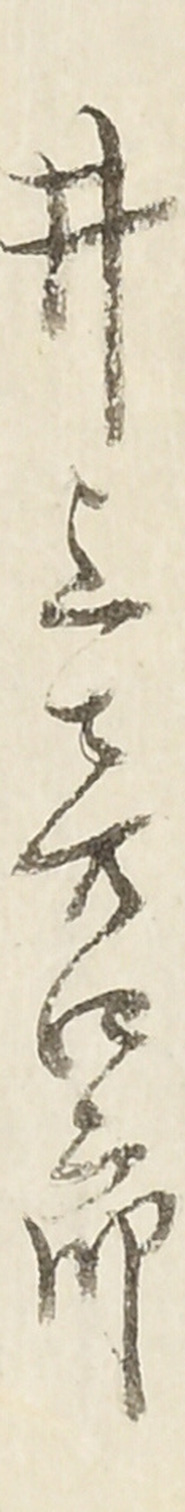井上喜四郎
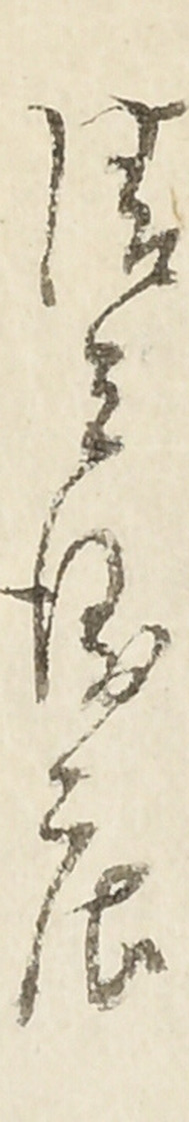清兵衛店
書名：秘書
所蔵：伊那市立高遠町図書館・合同会社AMANE
